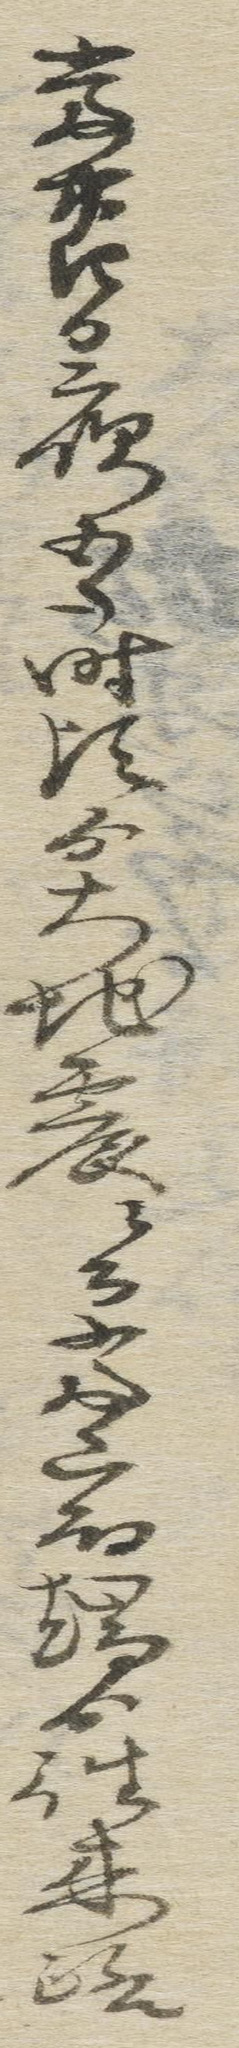当廿四日夜五ッ時頃ゟ大地震二而当宿端ゟ往来路
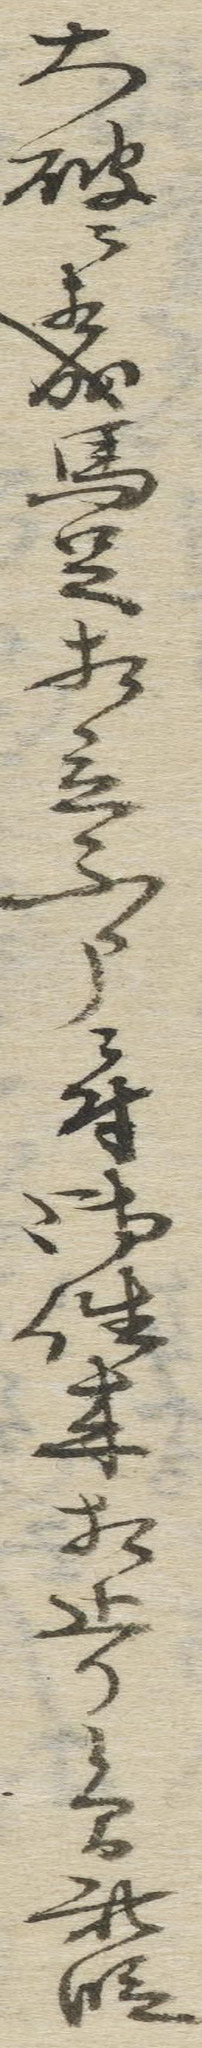大破二相成馬足相立不申二付御往来相止り候間此段
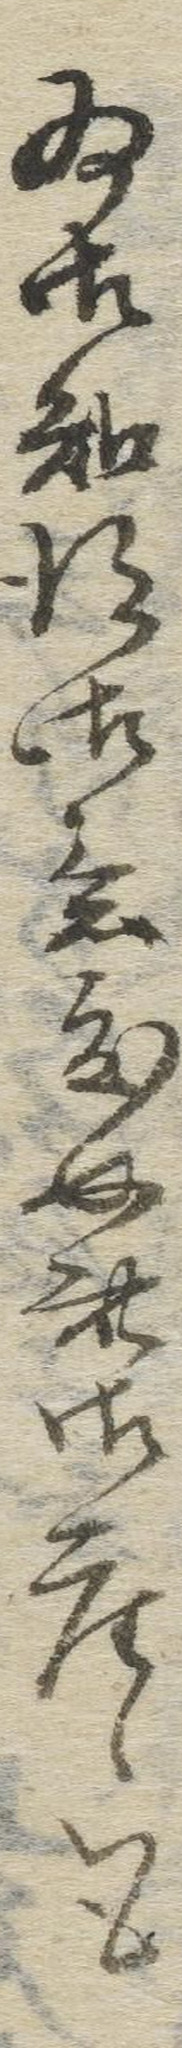為御知得御意度如斯御座候以上
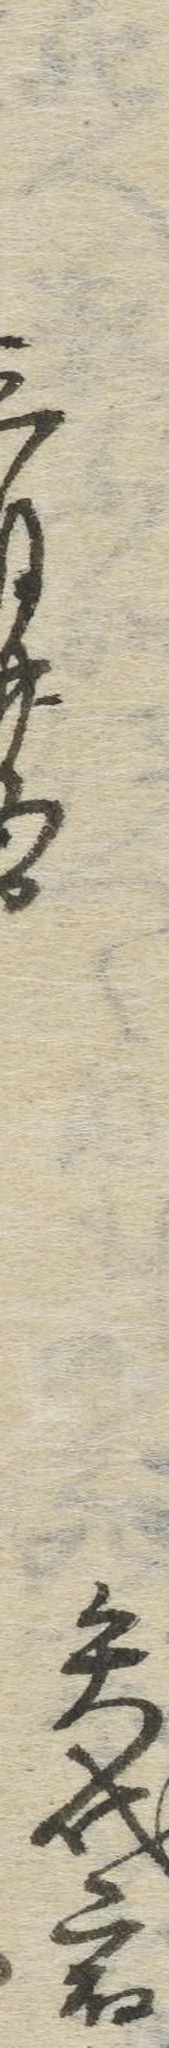三月廿五日矢代宿
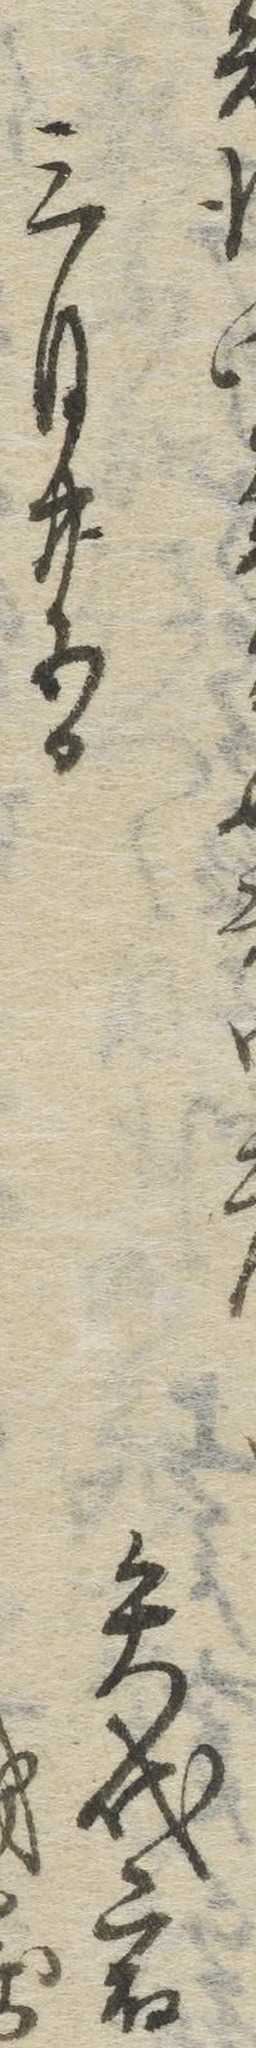三月廿五日矢代宿
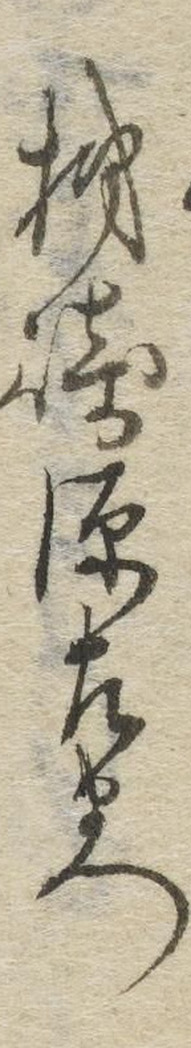柿崎源左衛門
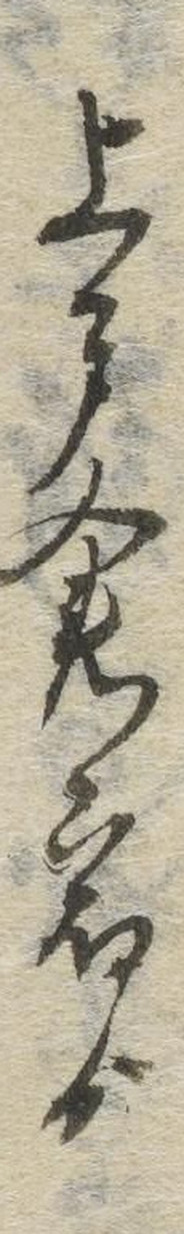上戸倉宿ゟ
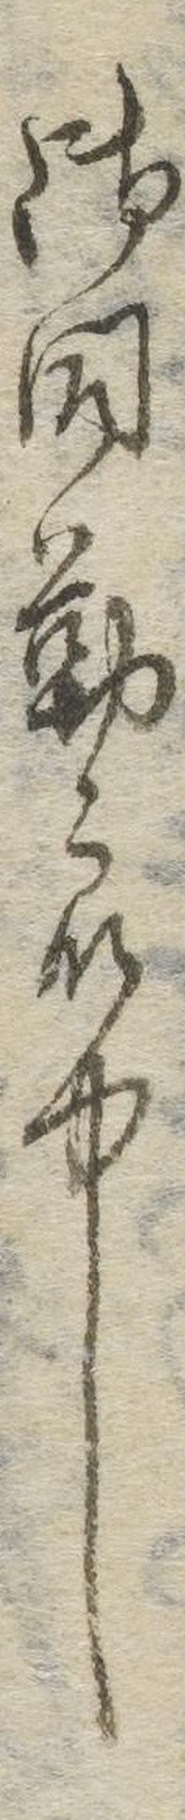御同勤衆中
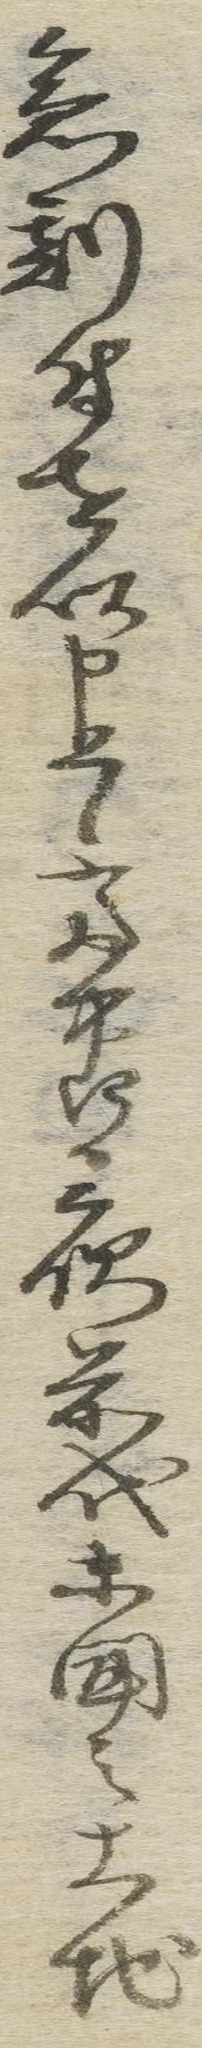急刻付左以申上候当廿四日夜前代未聞之大地
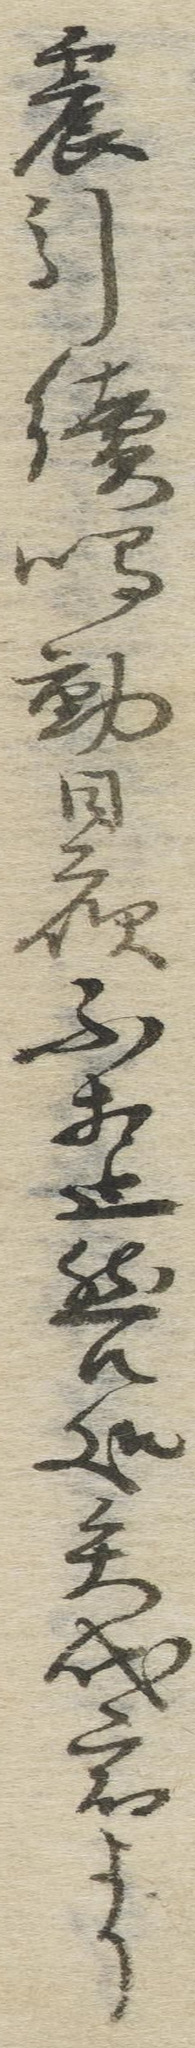震引続鳴動日夜不相止然ㇽ処矢代宿より

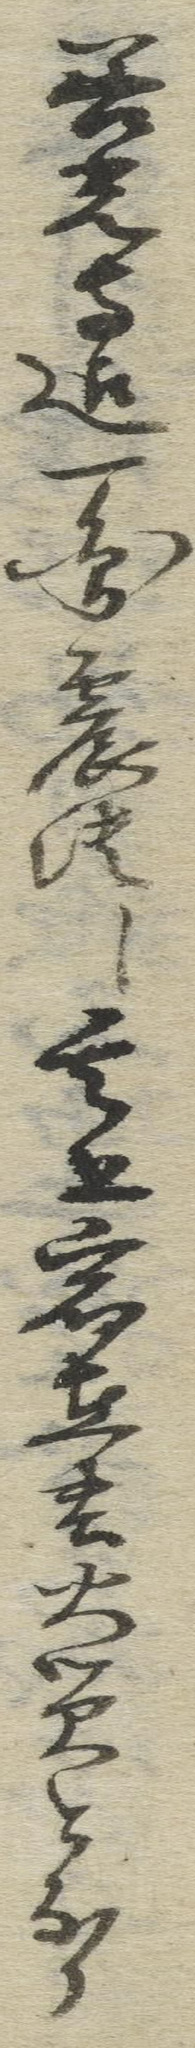善光寺迄一圓震潰し其上宿在共火災となり
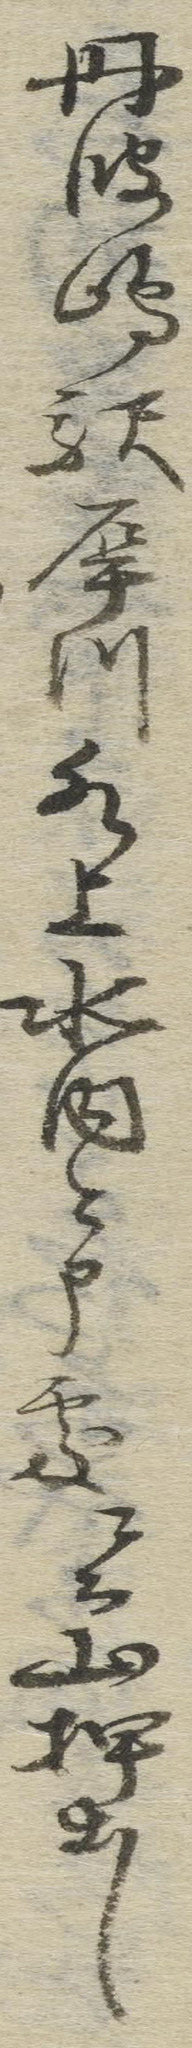丹波嶋駅犀川水上水内と申処二而山押出し
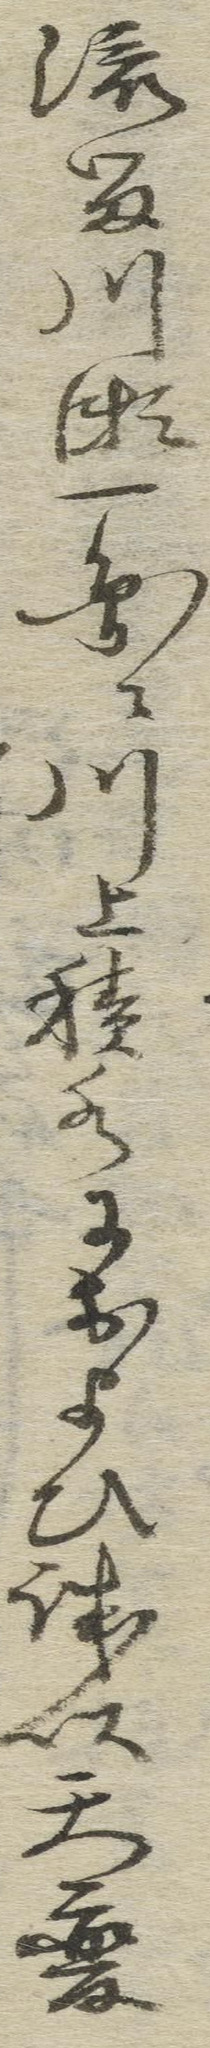流留川瀬一圓二川上積水におよひ誠以天変
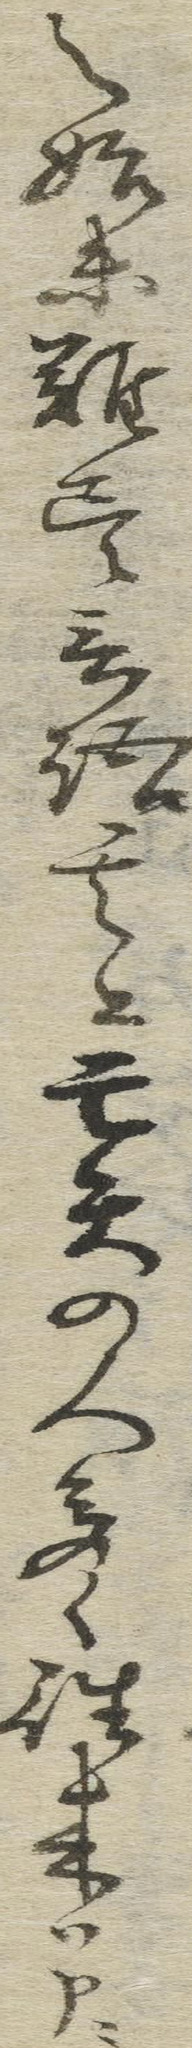之始末難尽言語二其上亡失の人多く往来ハ申二
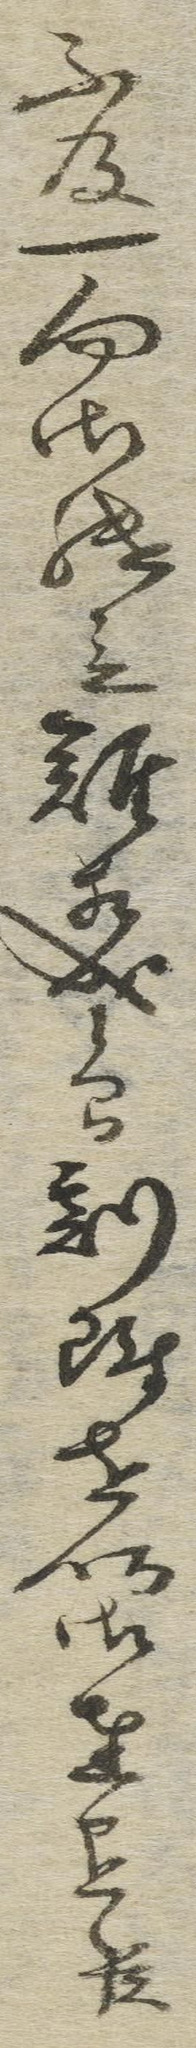不及一向御継立難相成候間刻附を以御達申上度
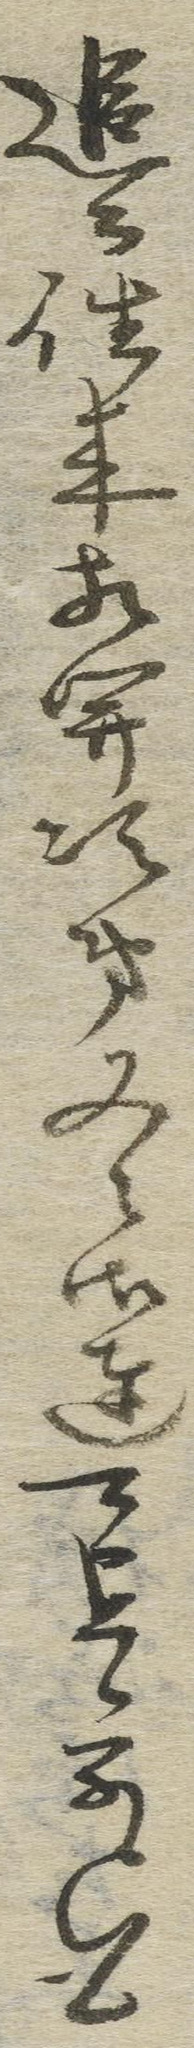追而往来相開次第又々御達可申上候草々以上
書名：信濃越後　地震書留
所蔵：東京大学地震研究所図書室 Earthquake Research Institute Library, The University of Tokyo, JAPAN
